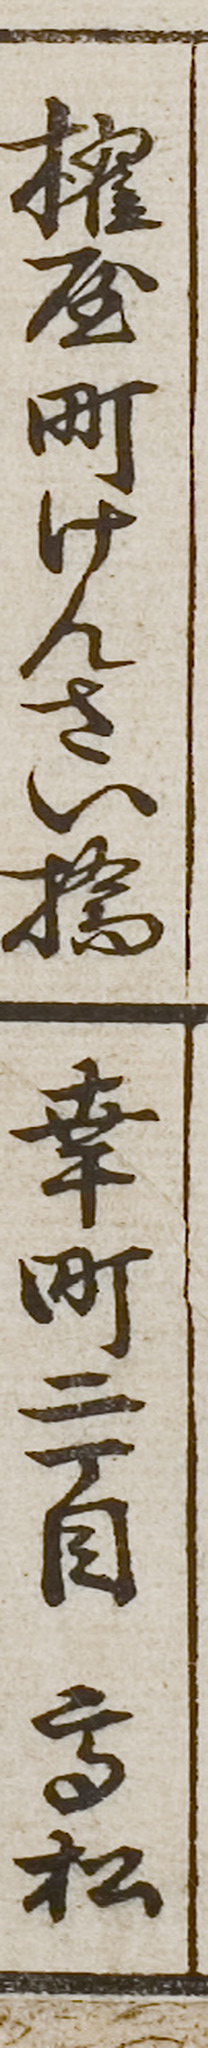櫂屋町けんさい橋幸町二丁目高松
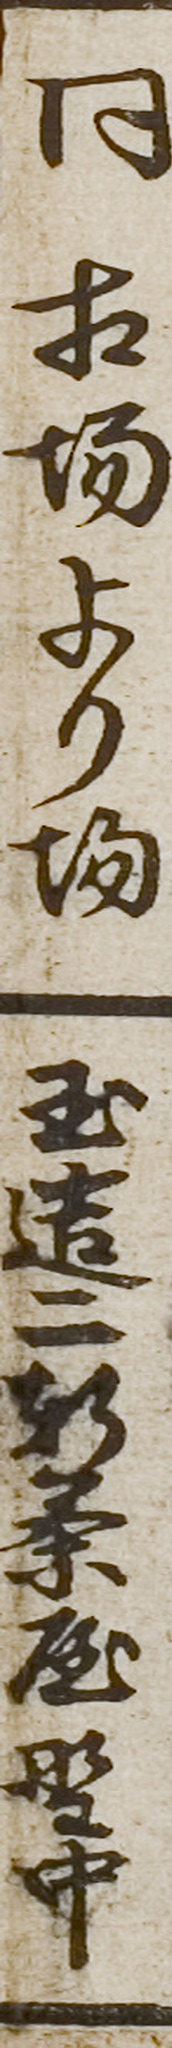同相場より場玉造二軒茶屋野中
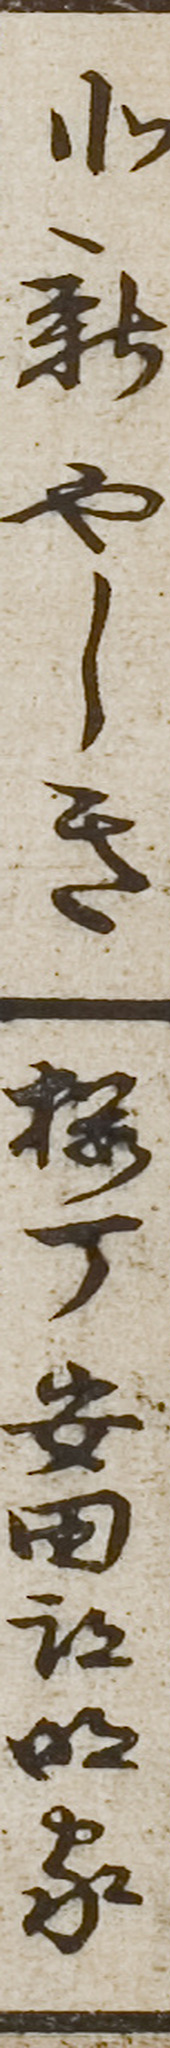北新やしき桜丁安田跡明家
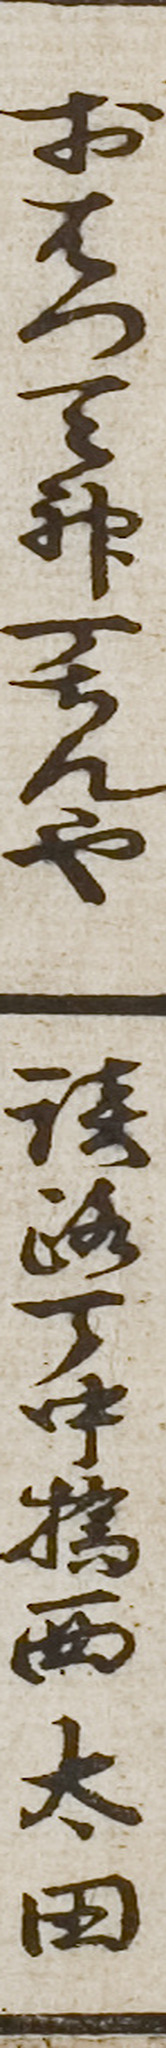おはつ天神丁ちんや淡路丁中橋西太田
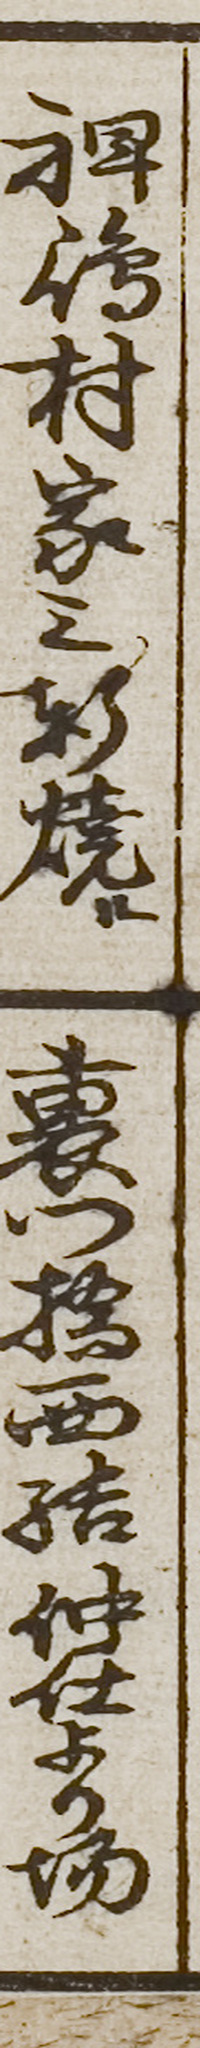稗嶋村家三軒焼る裏門橋西詰仲仕より場
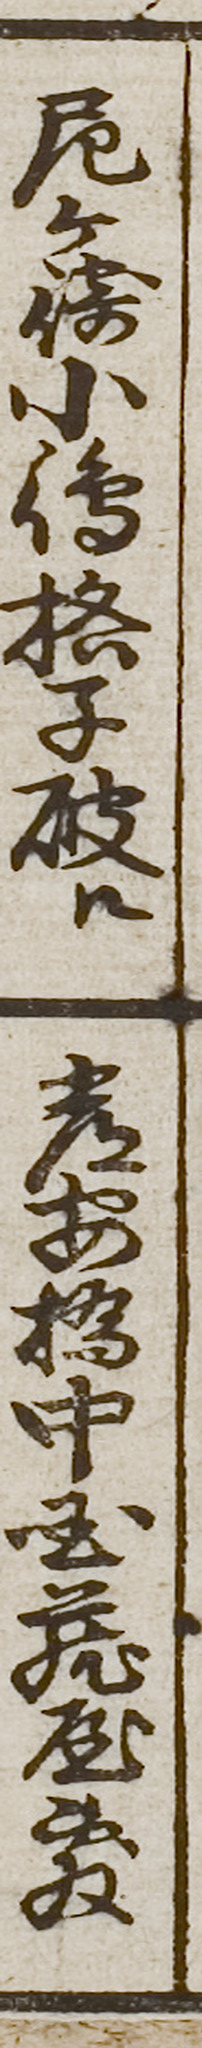尼ケ崎小傳格子破る常安橋中国蔵屋敷
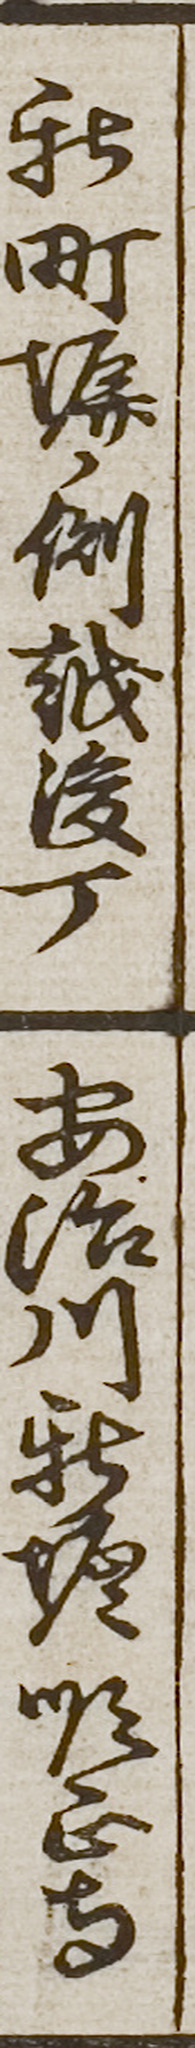新町塀の側越後丁安治川新堀順正寺
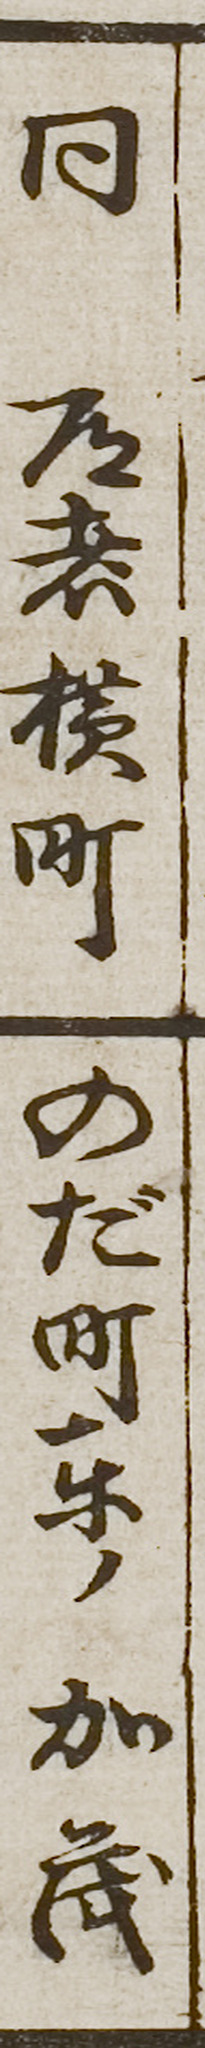同道者横町のだ町東の加茂
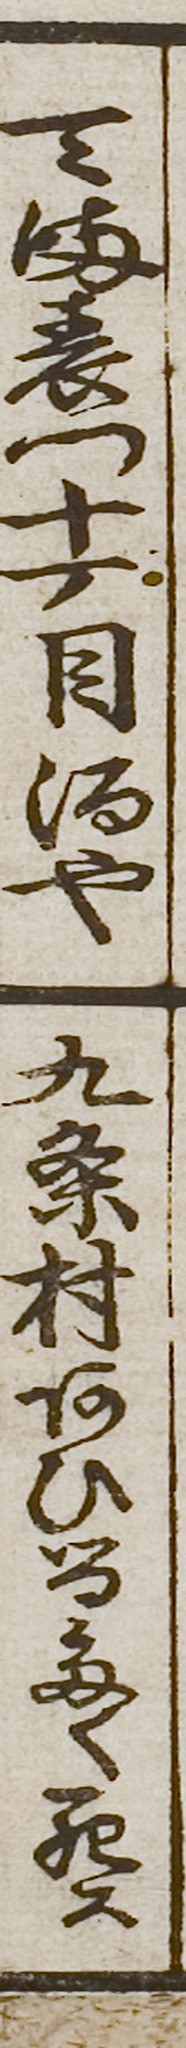天満表門十丁目酒や九條村あひる多く死す
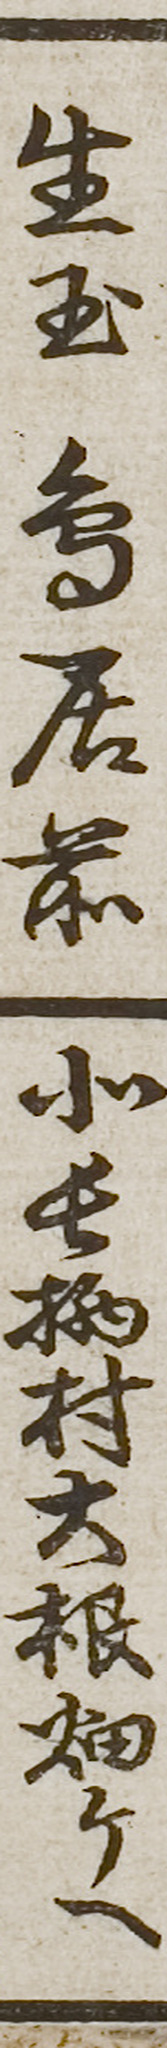生玉鳥居前北長柄村大根畑けへ
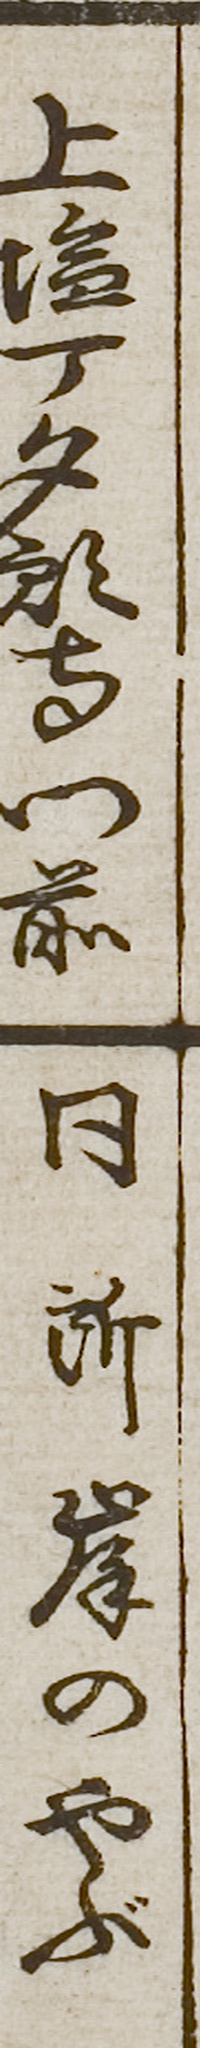上塩丁夕願寺門前同所岸のやぶ
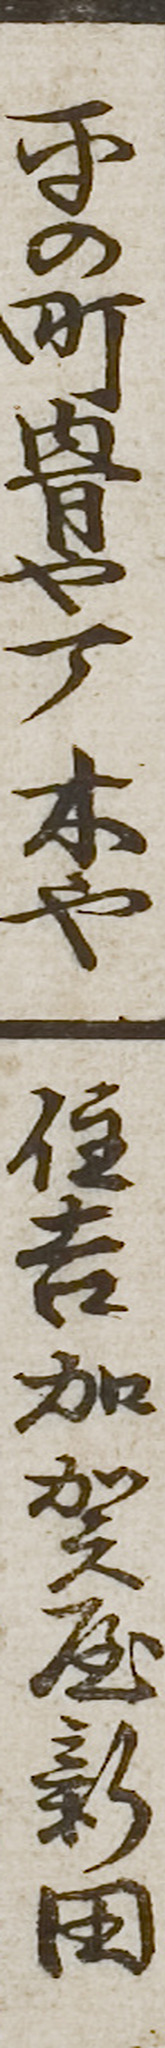平の町骨や丁木や住吉加賀屋新田
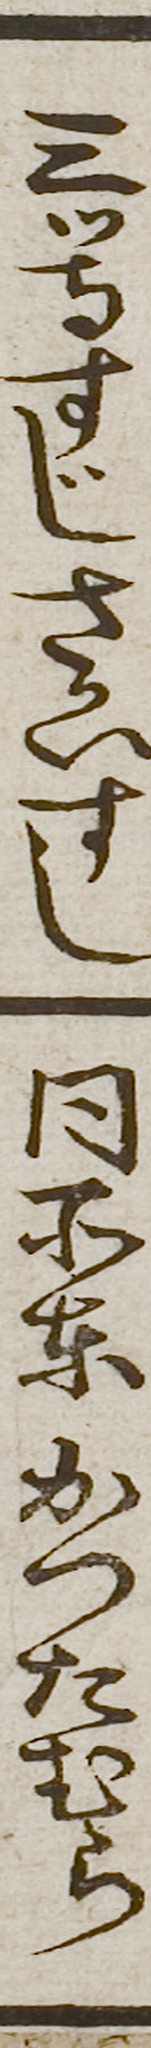三ツ寺すじさかいすし同所東かつたむら
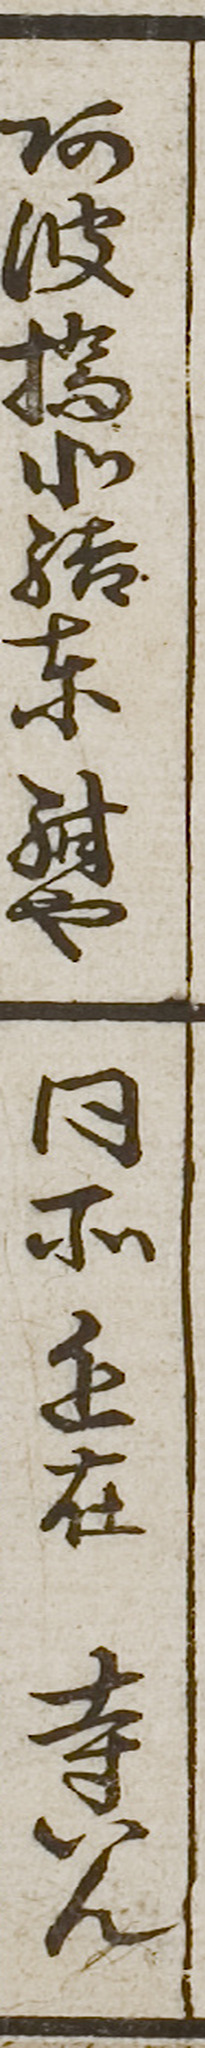阿波橋北詰東紺や同所近在寺いん
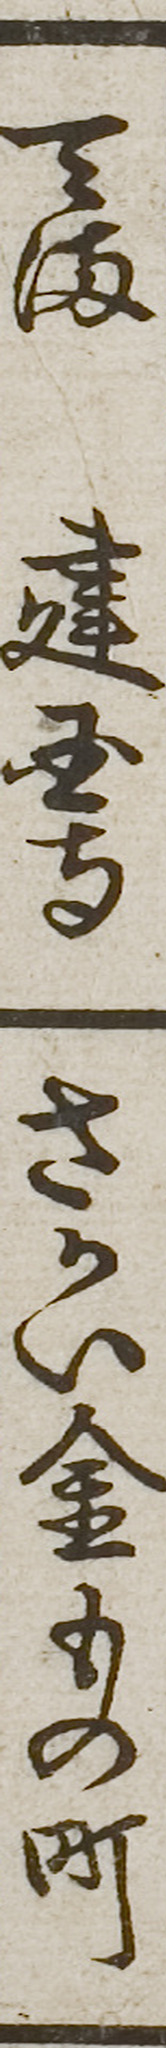天満建国寺さかい金もの町
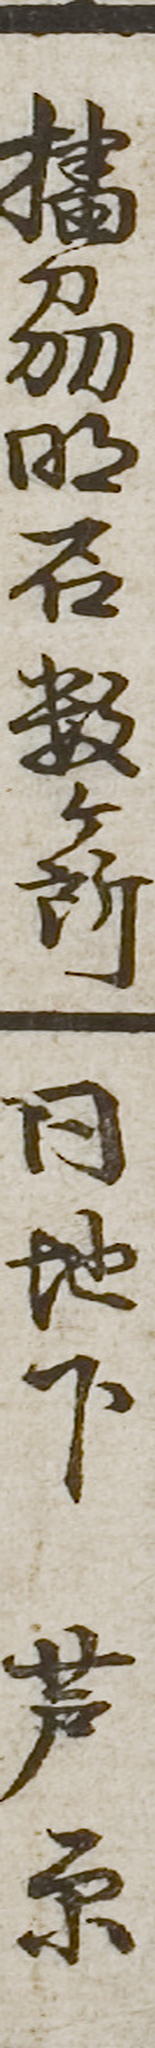播州明石数ヶ所同地下芦原
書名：浪花大雷落場所附
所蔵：東京大学総合図書館 General Library in the University of Tokyo, JAPAN
